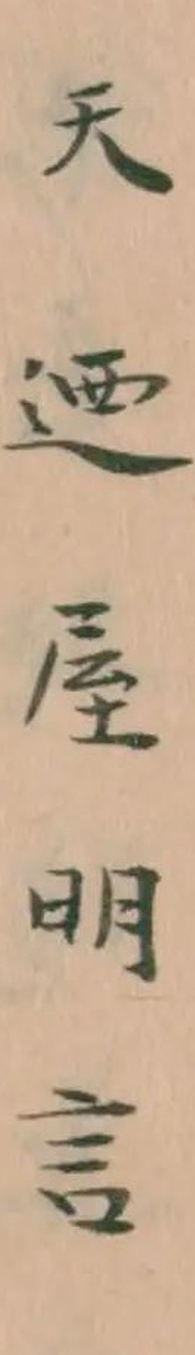天迺屋明言
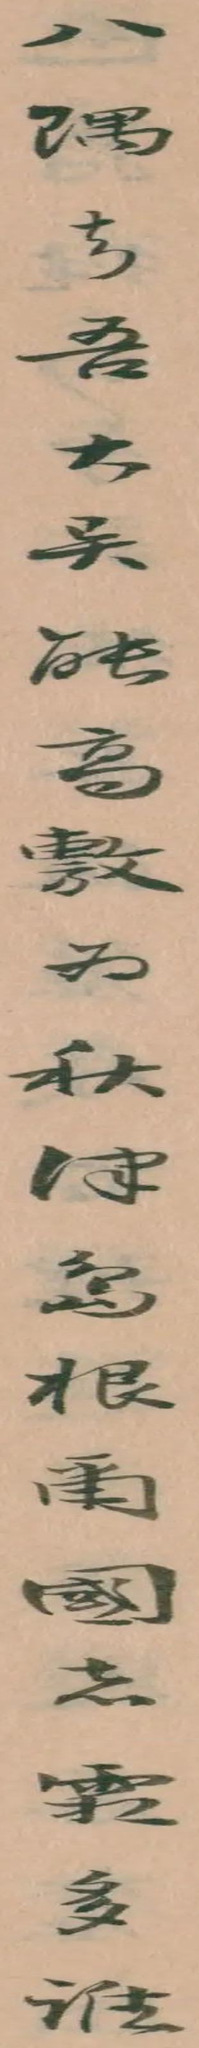八隅知吾大君能高敷為秋津島根爾国者霜多誰
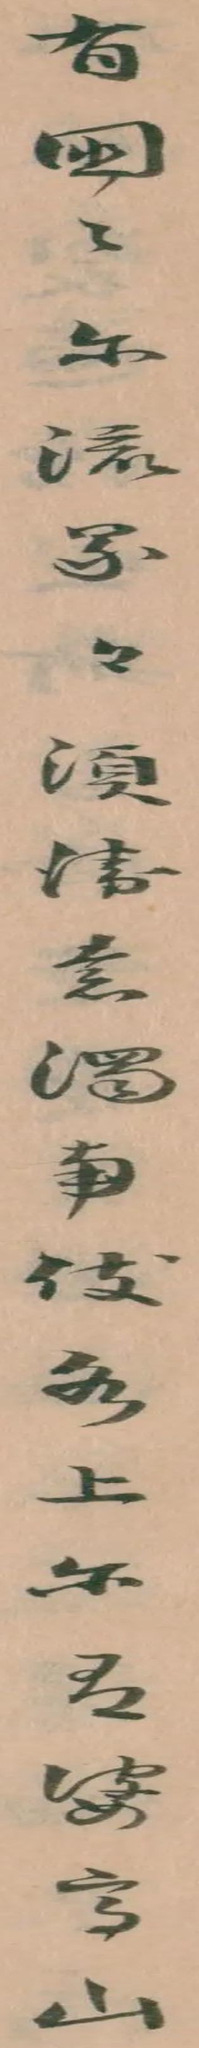有囦々尓流累々須衛裳濁南伎水上尓有婆高山
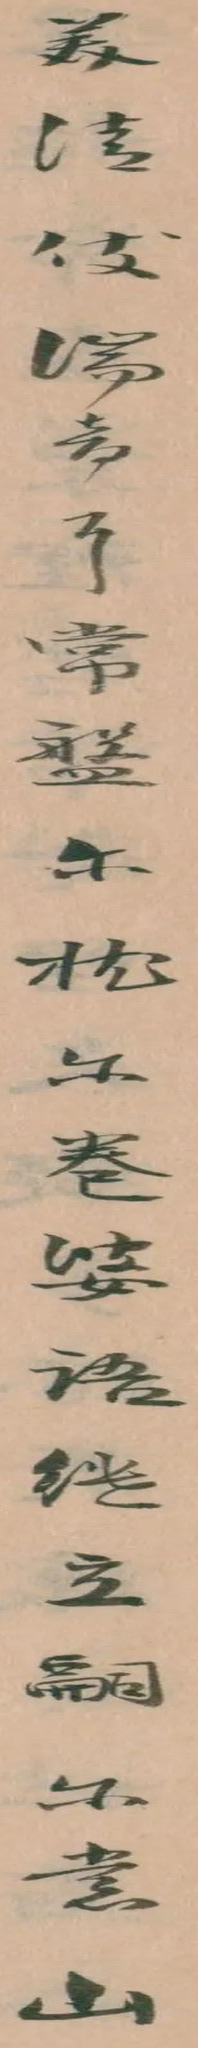美清伎湍音耳常盤尓枕尓巻婆語継立嗣尓裳山
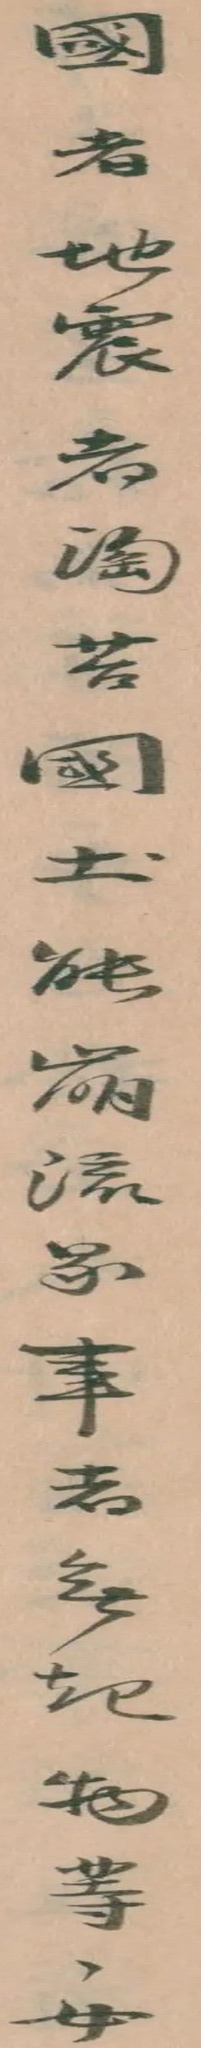国者地震者淘苔国土能崩流累事者無起物等ヽ女
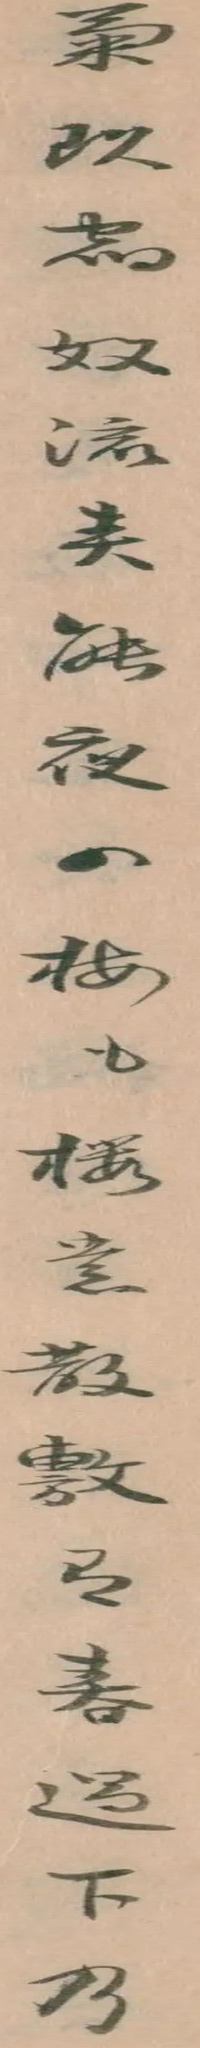気玖宿奴流春能夜の梅も桜裳散敷有春過下乃
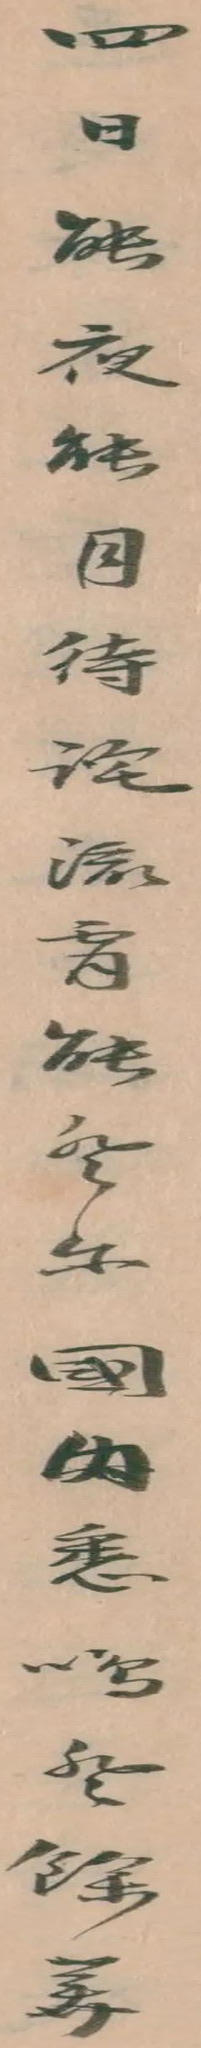四日能夜能月待詫流宵能登尓国内悉鳴登余美
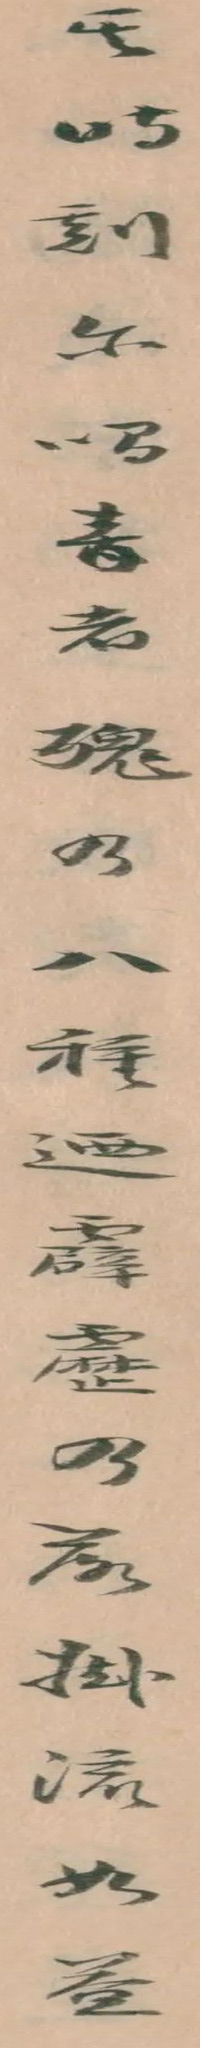其時刻尓鳴音者魄乃八種迺霹靂乃落掛流如益
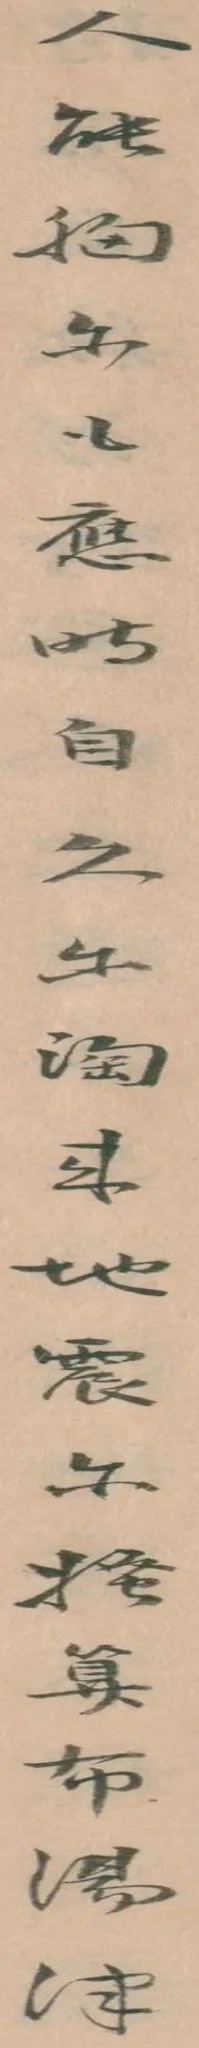人能胸尓も応時自久尓淘来地震尓掻算布湯津

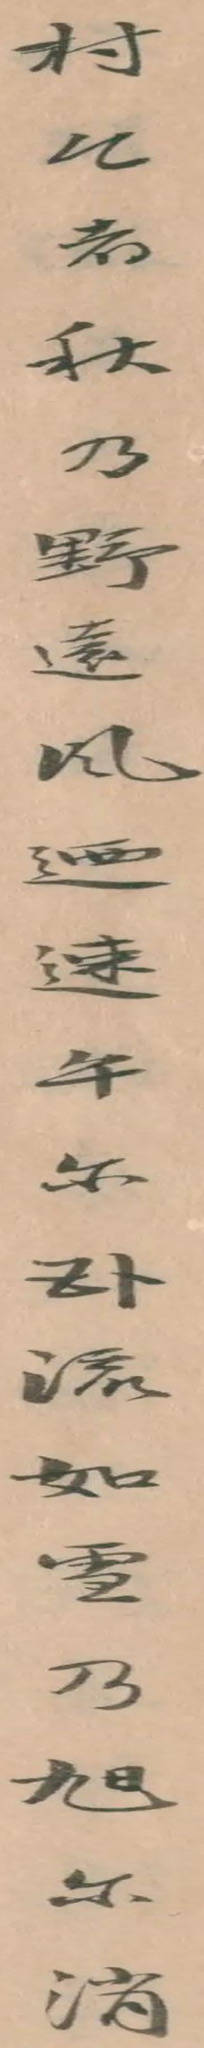村今者秋乃野遠風迺速午尓臥流如雪乃旭尓消
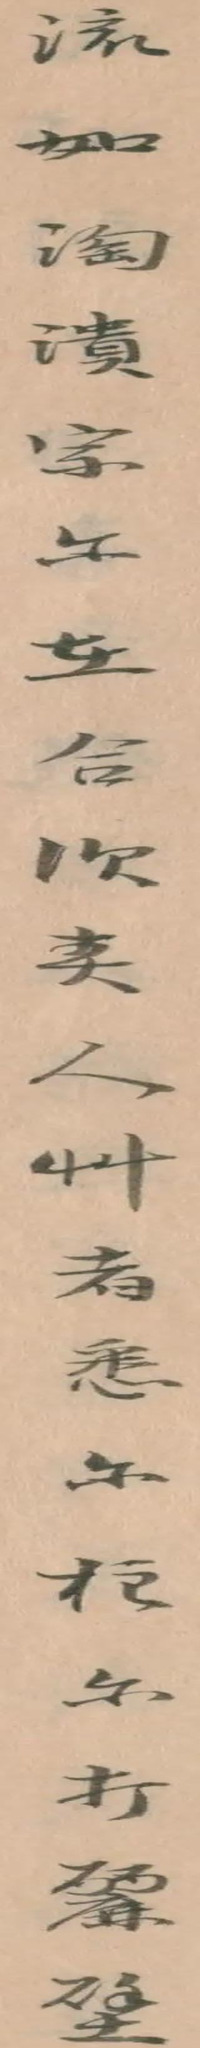流如淘潰家尓在合次春人艸者悉尓柱尓打麗壁
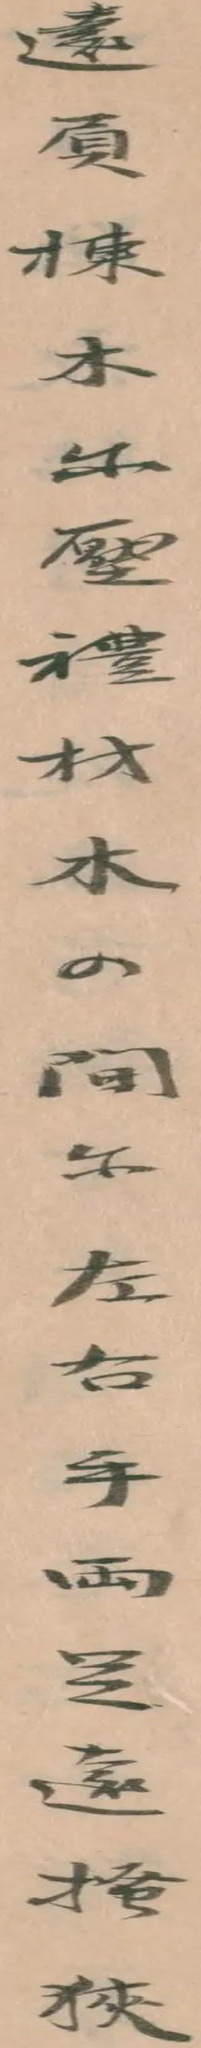遠負棟木尓圧礼材木の間尓左右手両足遠掻挟
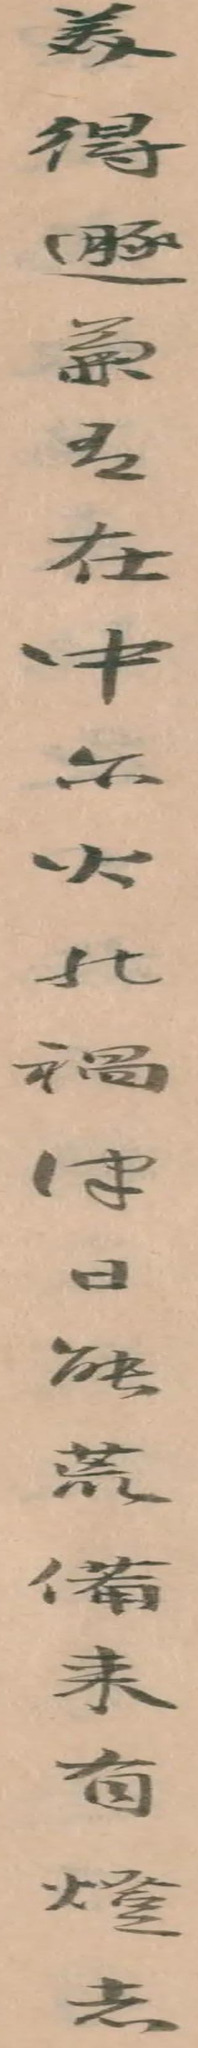美得遯兼有在中尓火能禍津日能荒備来有灯者
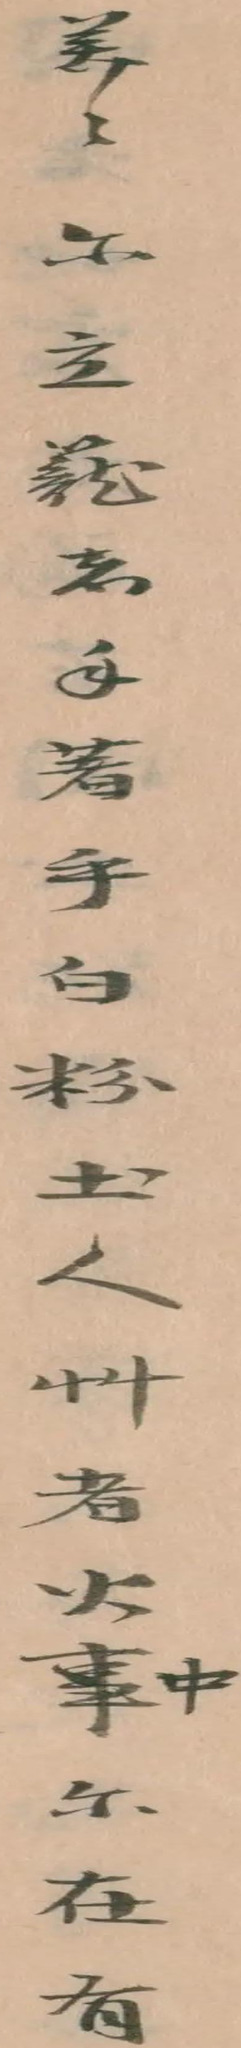美々尓立籠者手著乎白粉土人艸者火中尓在有
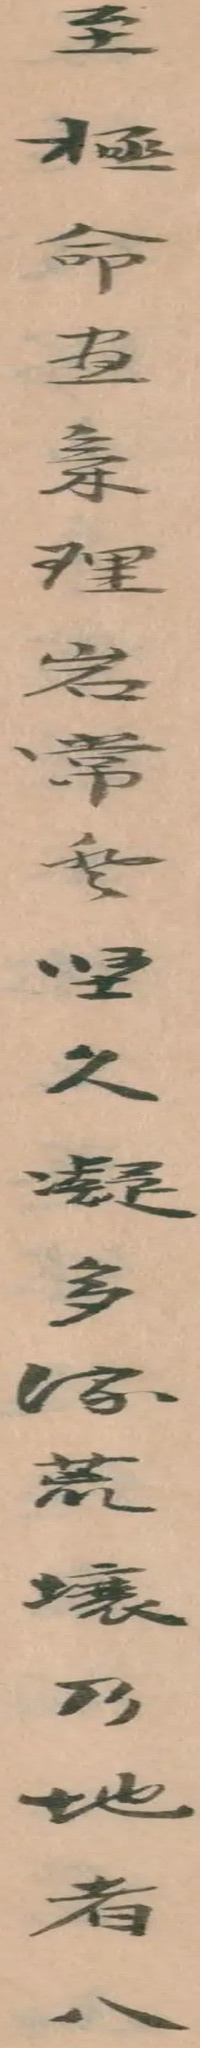至極命置気理岩常登堅久凝多流荒壌乃地者八
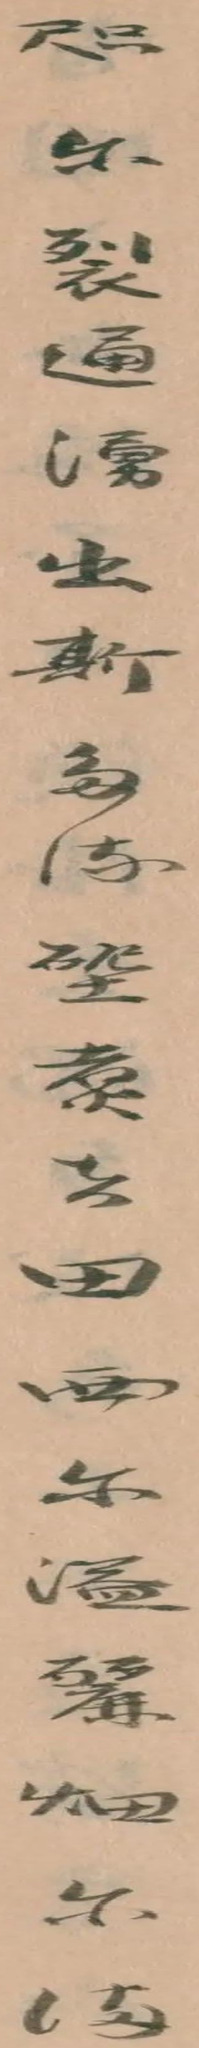咫尓裂通湧出斯多流壁煮者田西尓溢麗畑尓満
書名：地災撮要. 巻5-6(地震之部)
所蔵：国立国会図書館 National Diet Library, JAPAN
